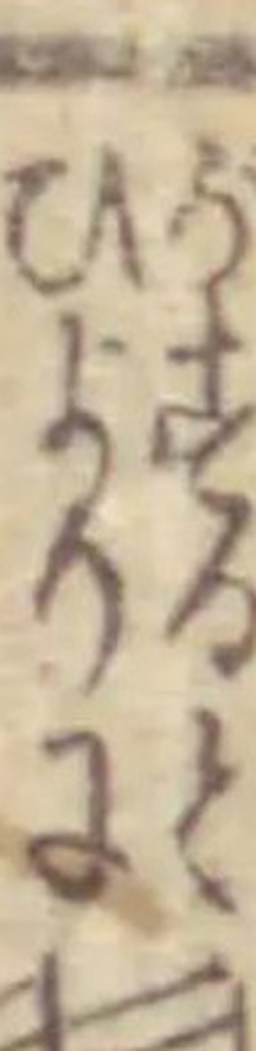いよりに
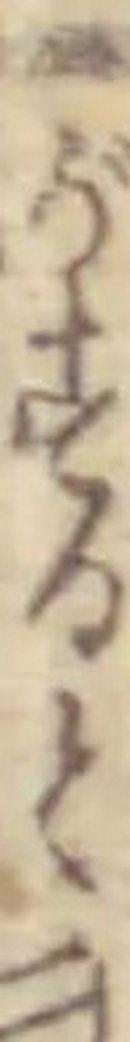がすると
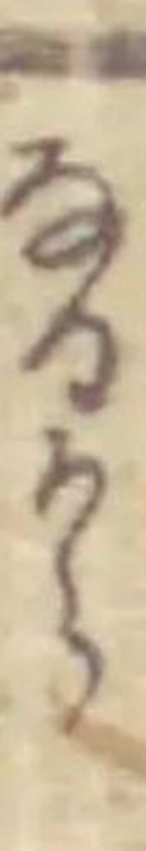なるから
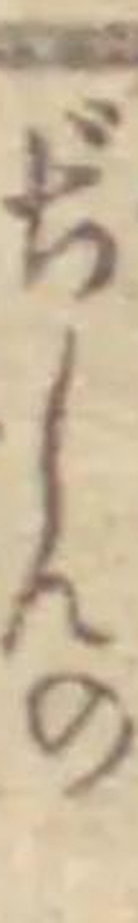ぢしんの
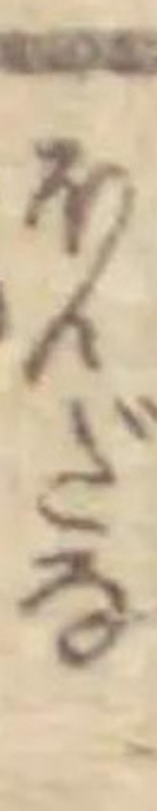ほんだな
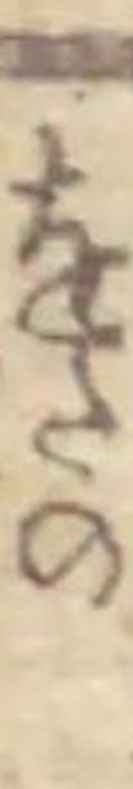をたの
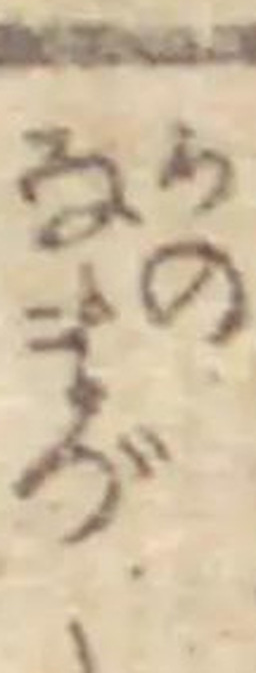なまづ
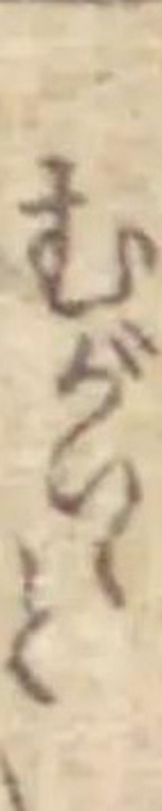むがいゝと
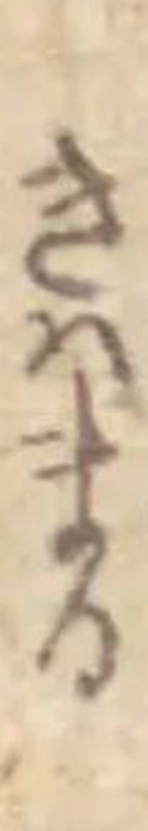きはまる
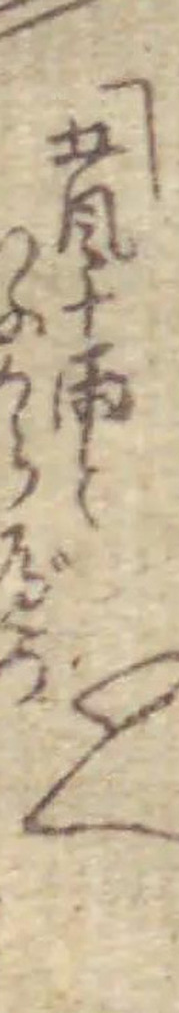〽五風十雨と
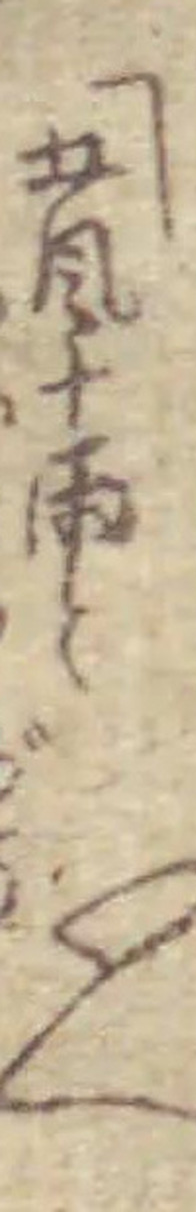〽五風十雨と
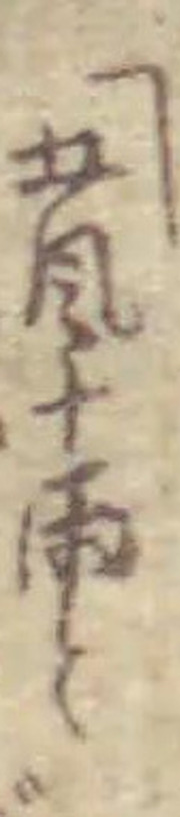〽五風十雨と
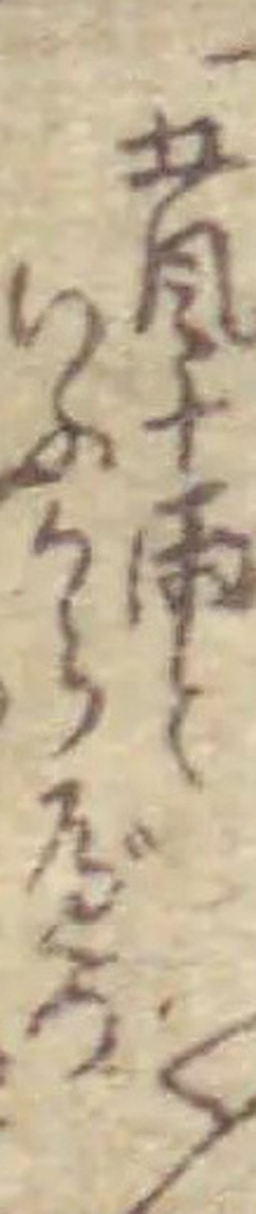いふからべつ
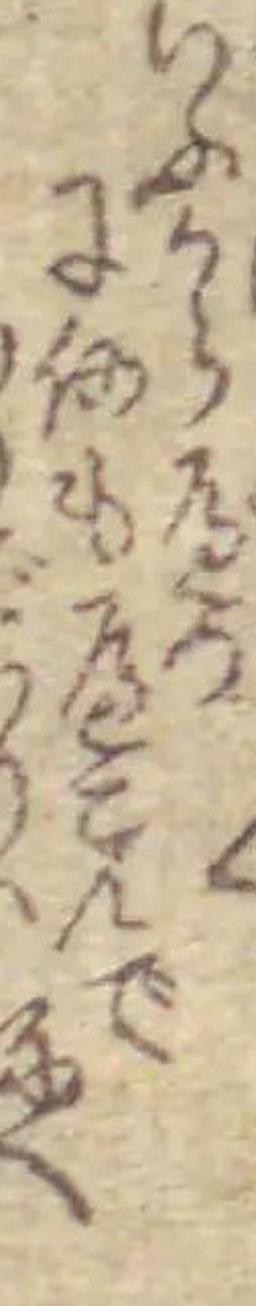に何もへこんで
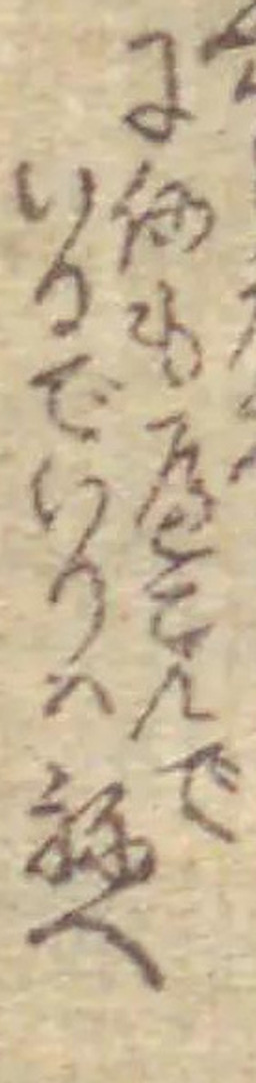いるでいりはねへ

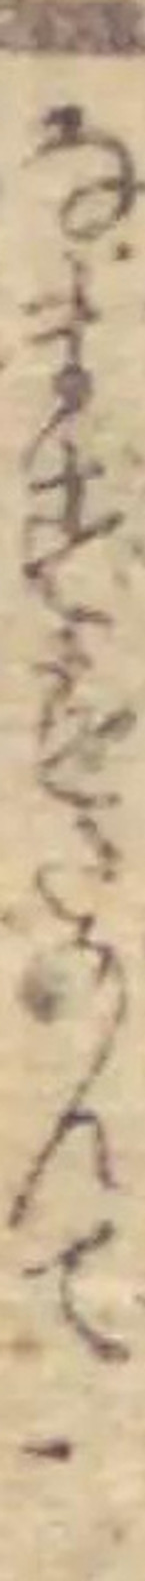なますをたのんで
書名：雨宮風宮出儘略縁記 3巻
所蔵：国立国会図書館 National Diet Library, JAPAN
